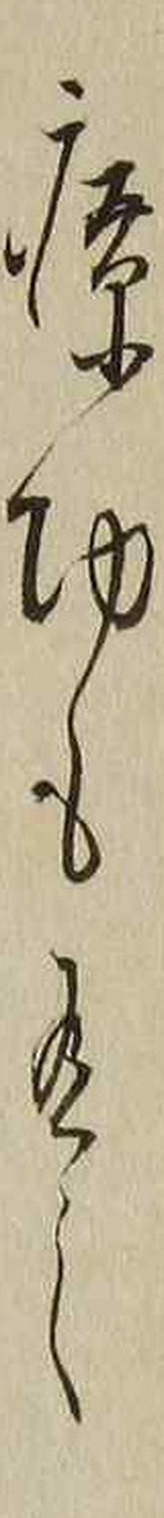療功も有之
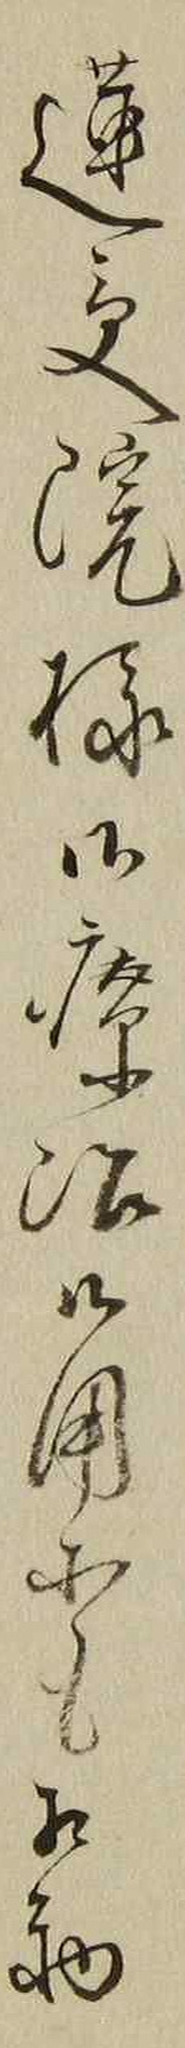蓮受院様御療治御用当も相勤
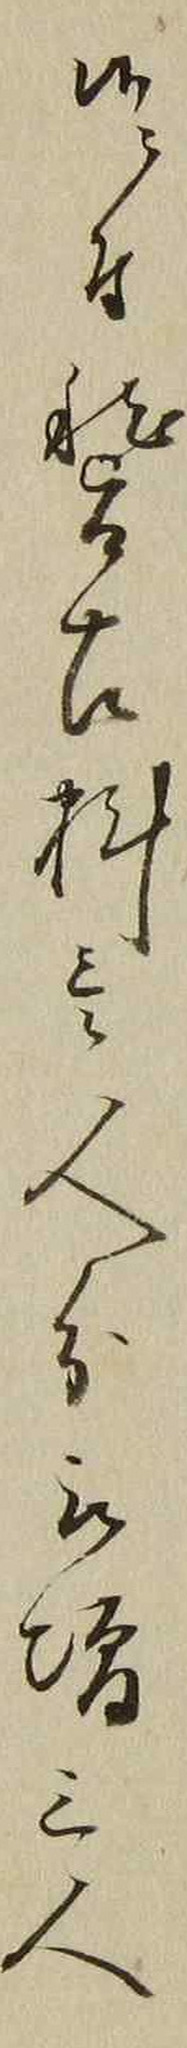候ニ付稽古料壱人分被増三人
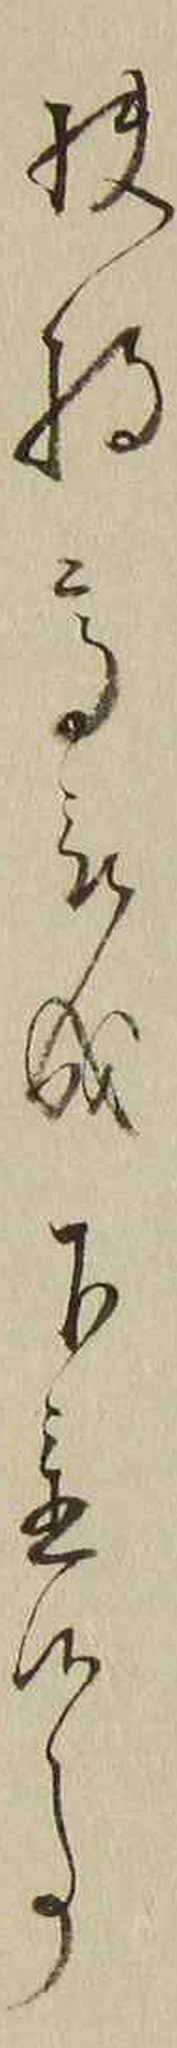扶持高被成下置候事
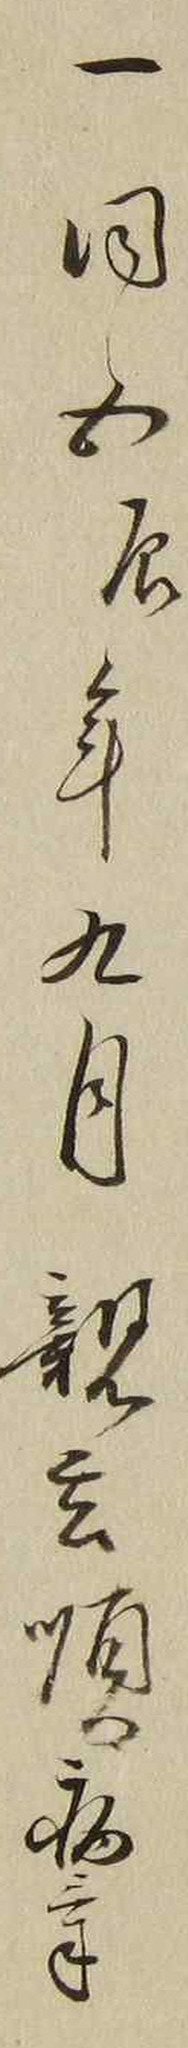一同五辰年九月親玄順病気
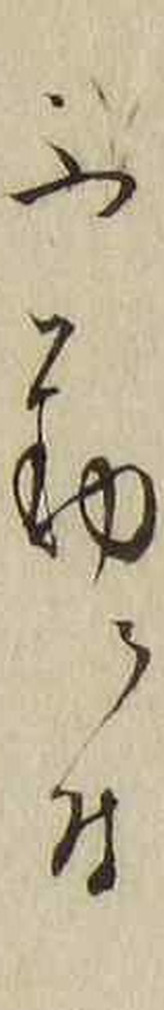不勤ニ付
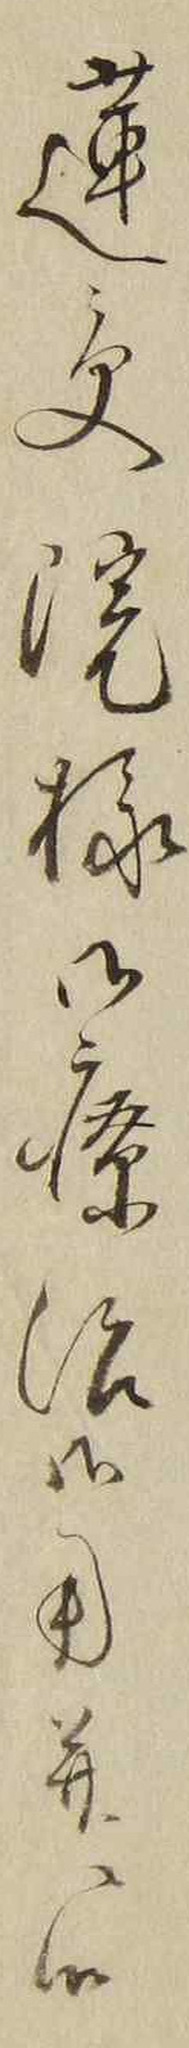蓮受院様御療治御用幷ニ御

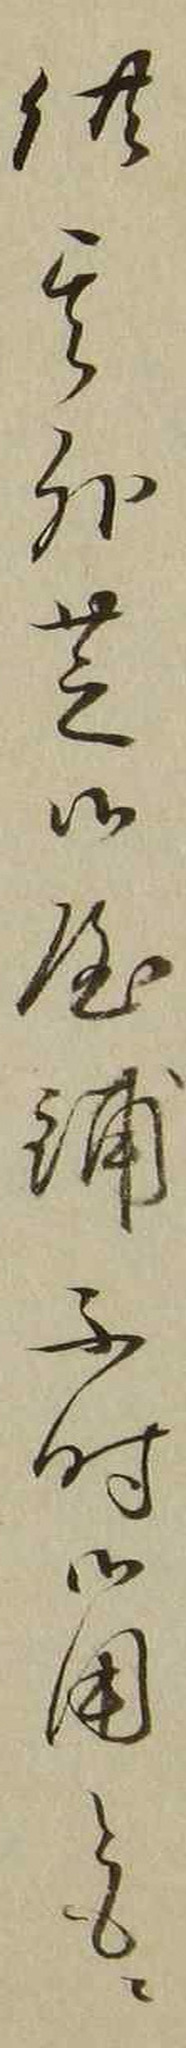供其外芝御屋鋪不時御用ともニ
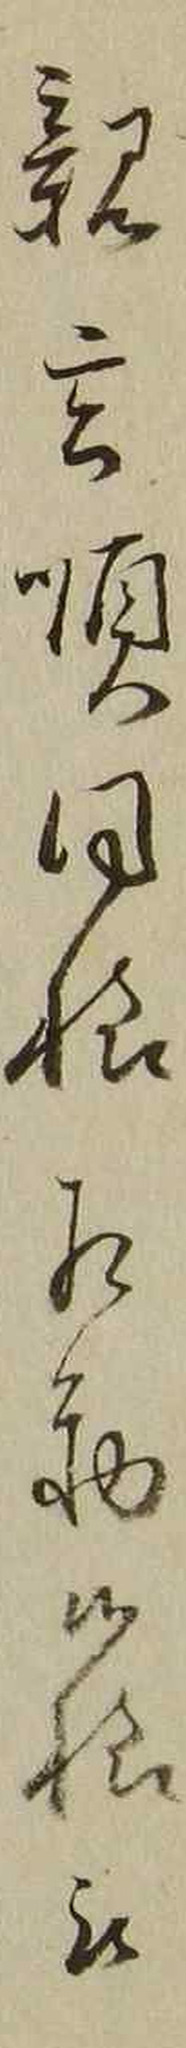親玄順同様相勤御用被
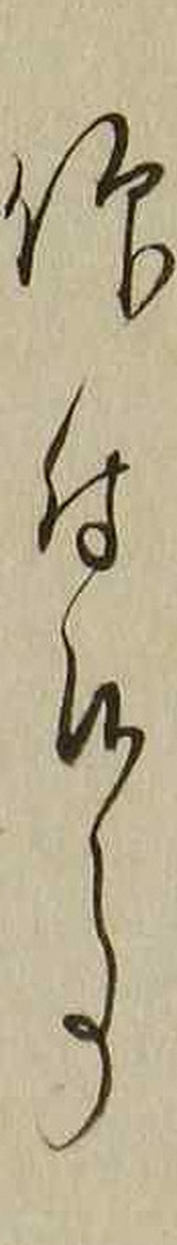仰付候事
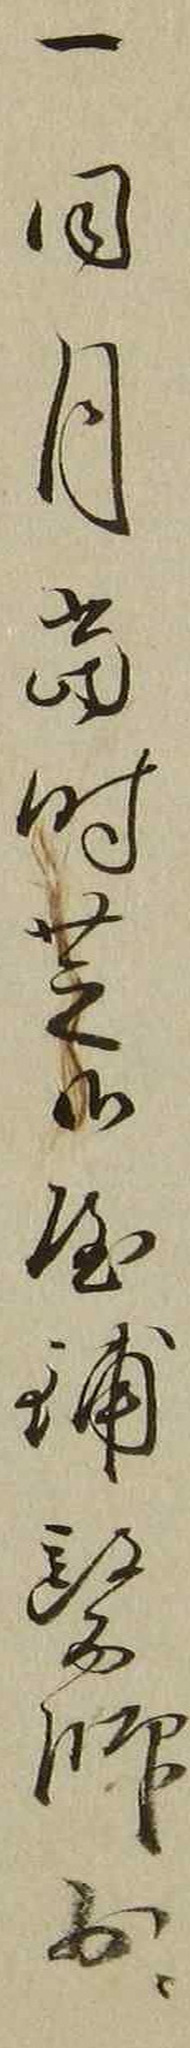一同月当時芝御屋鋪医師少ニ
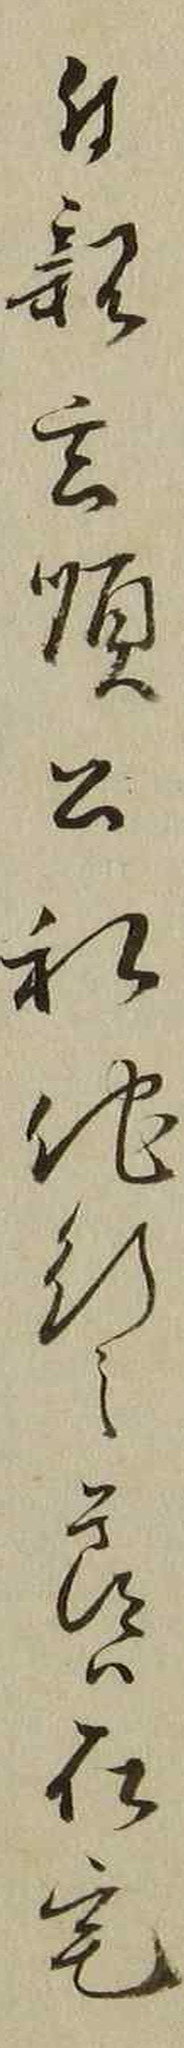付親玄順公私他行之節ハ在宅
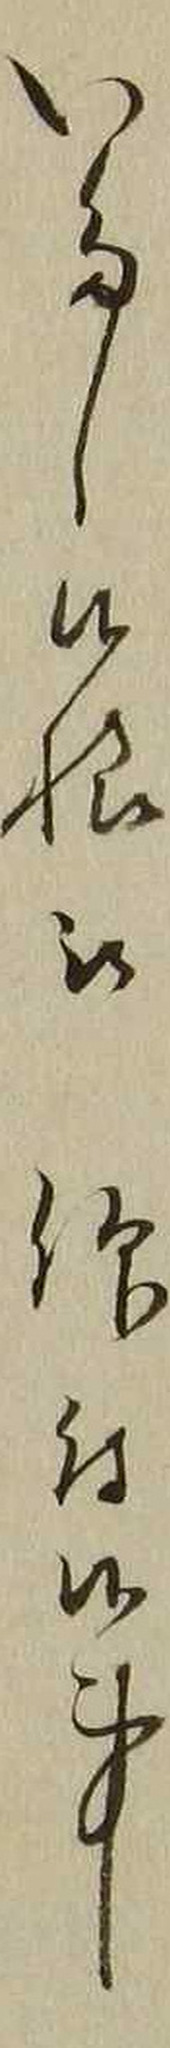いたし候様被仰付候事
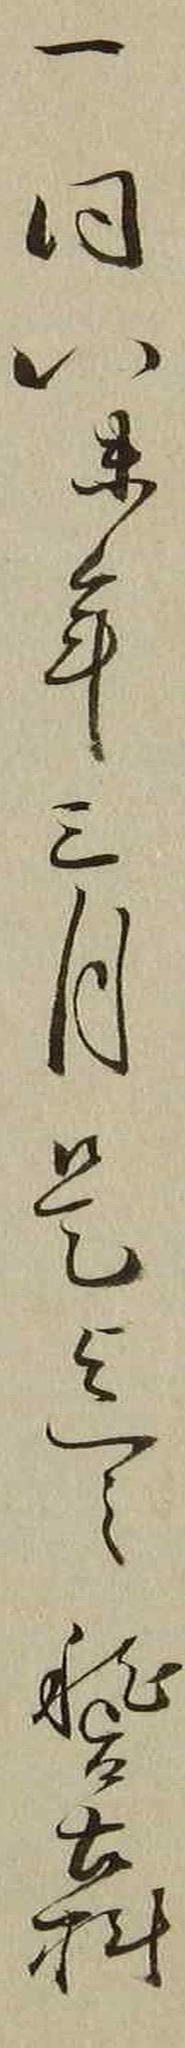一同八未年三月是迄之稽古料
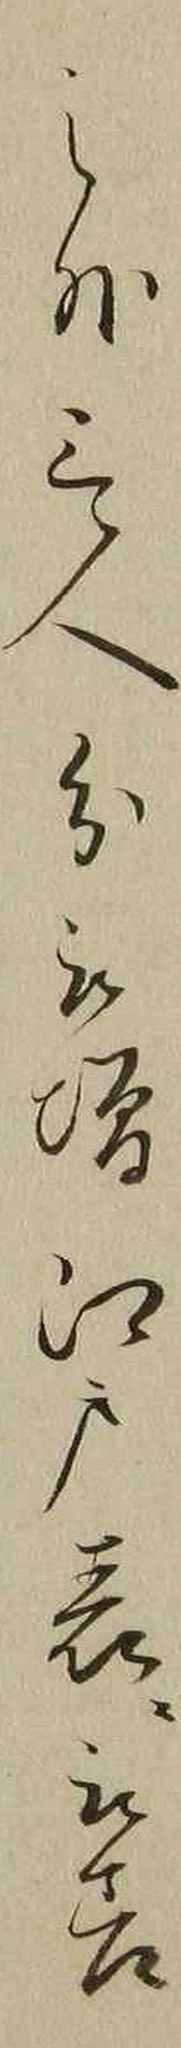之外三人分被増江戸表ニ被差
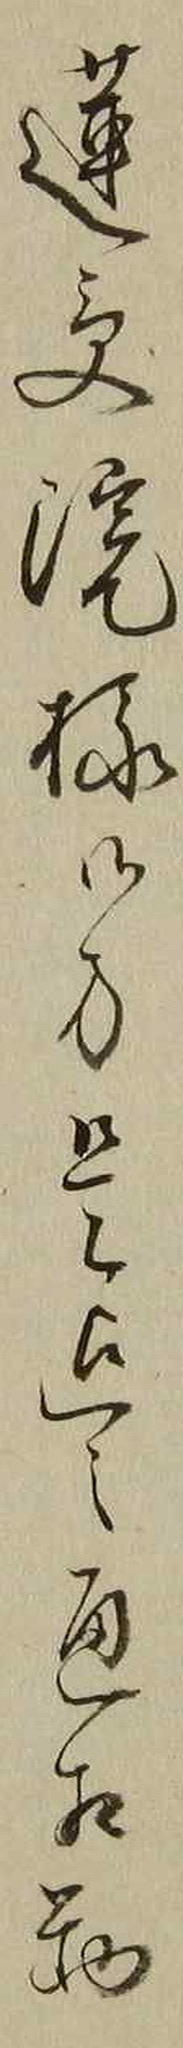蓮受院様御方是迄之通相勤
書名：諸士系譜　巻之129　た之部5
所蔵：会津若松市立会津図書館
